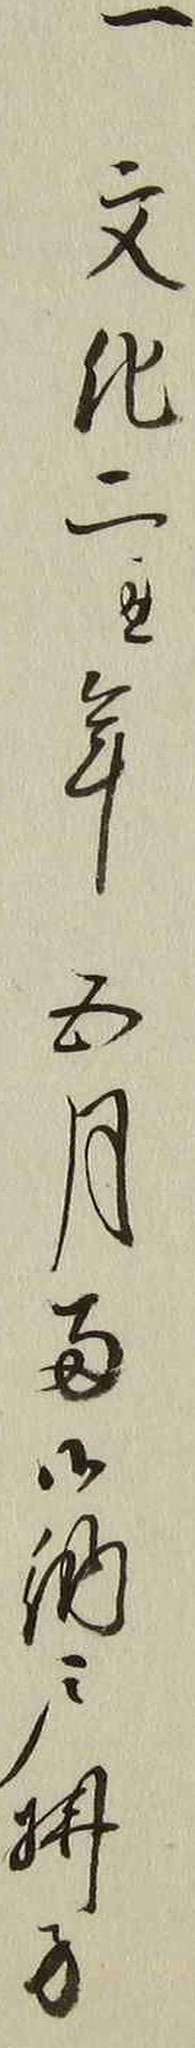一文化二丑年五月両御納戸払方
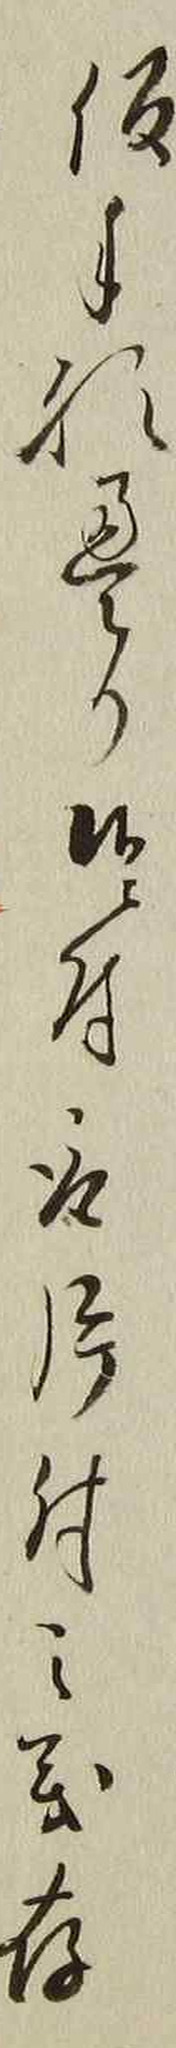仮手形畳り候ニ付取片付之義存
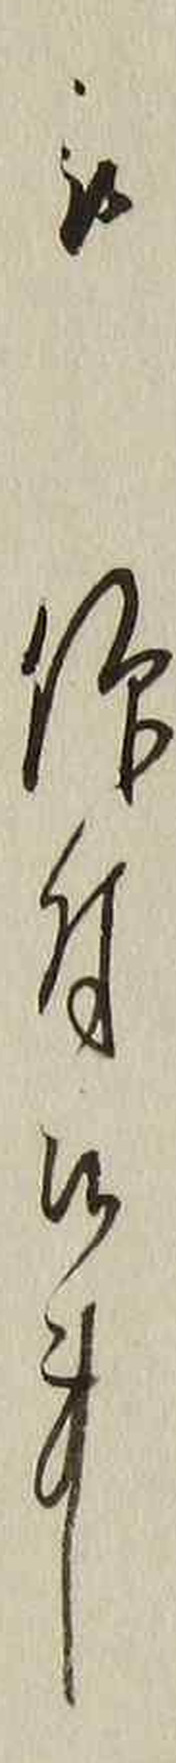被仰付候事
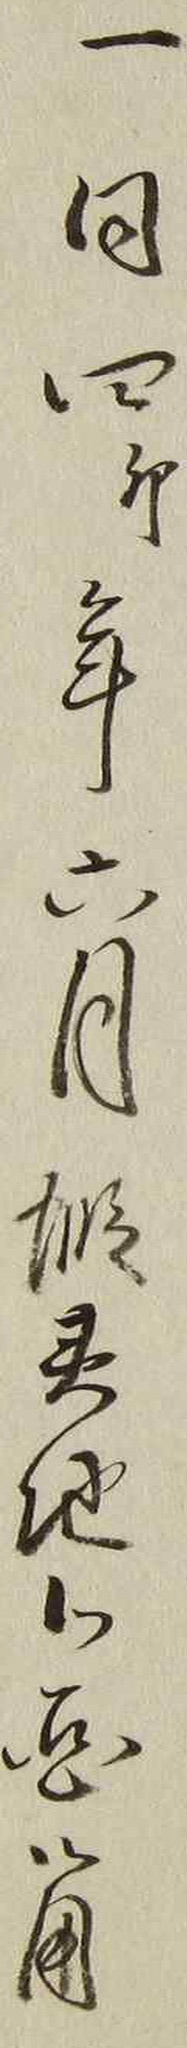一同四卯年六月蝦夷地御固御用
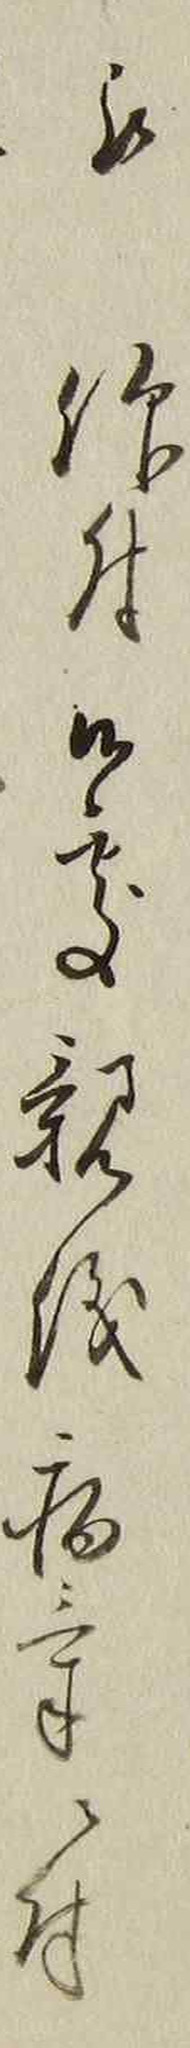被仰付候処親儀病気ニ付
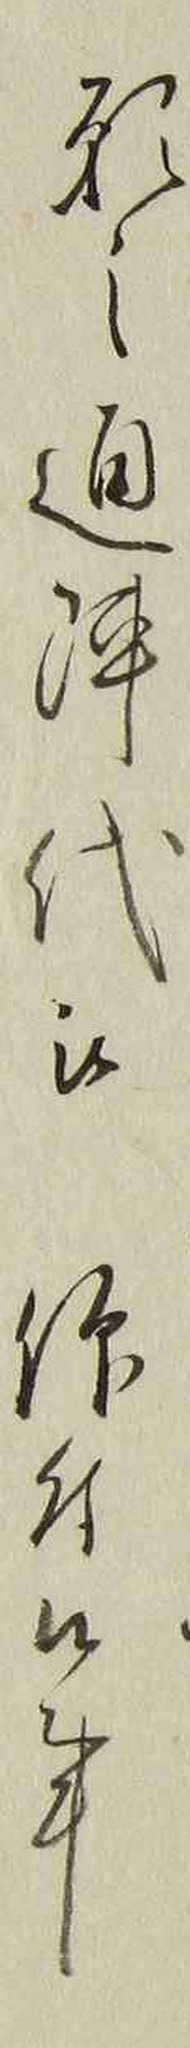願之通陣代被仰付候事
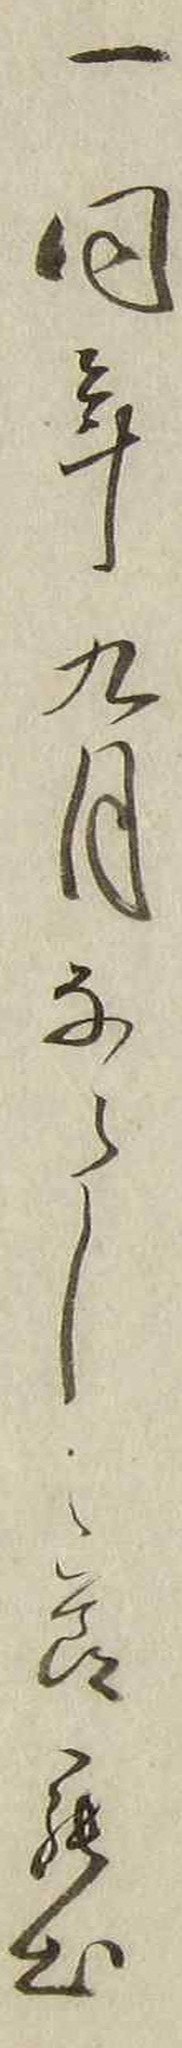一同年九月ならし之節罷出

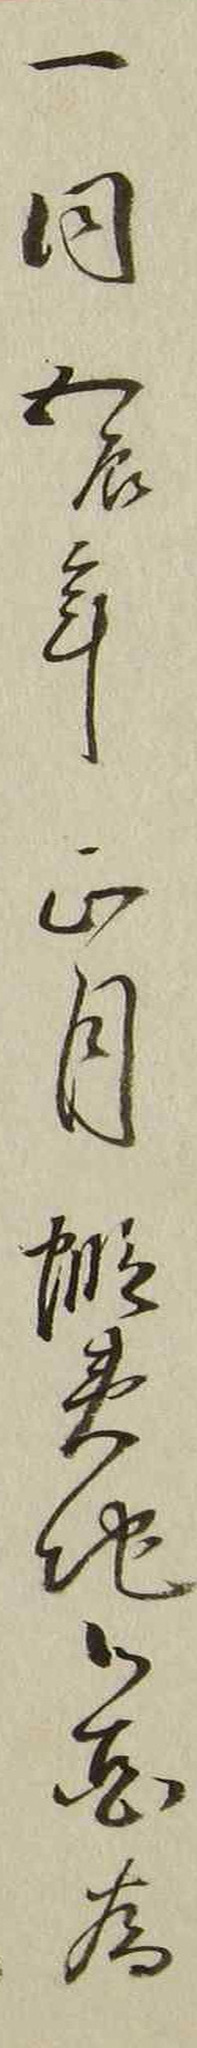一同五辰年正月蝦夷地御固為
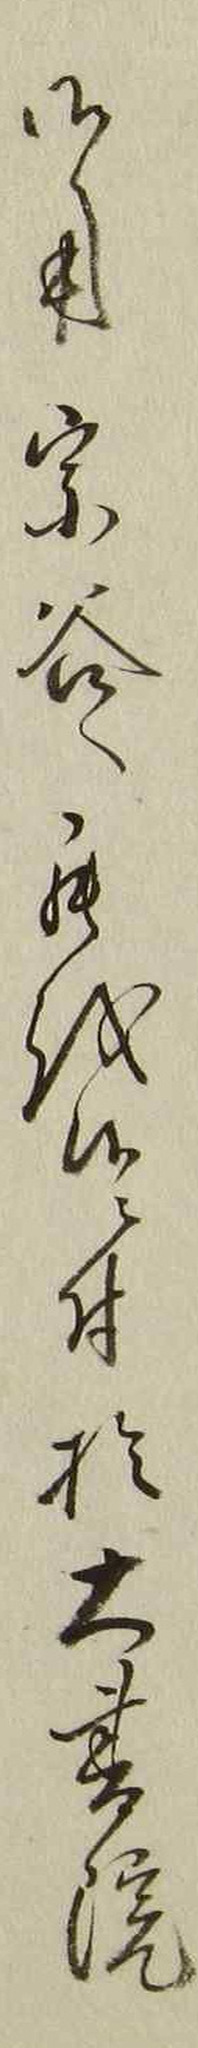御用宗谷へ罷越候ニ付於大書院
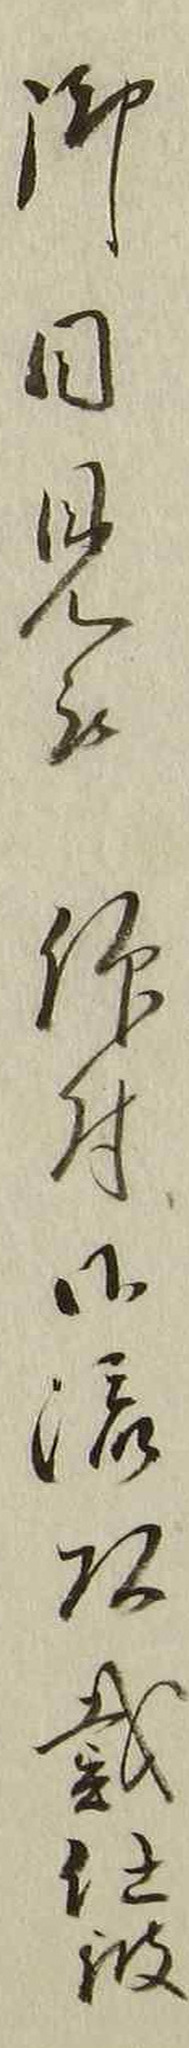御目見被仰付御流頂戴仕彼
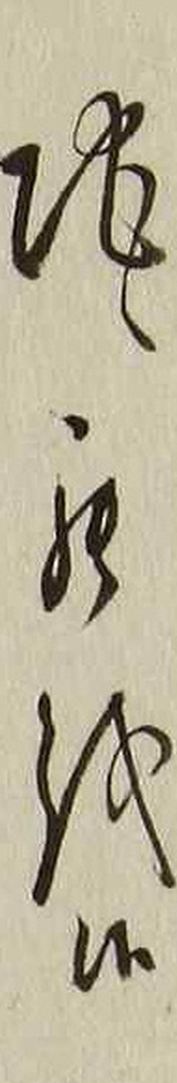地へ罷越候
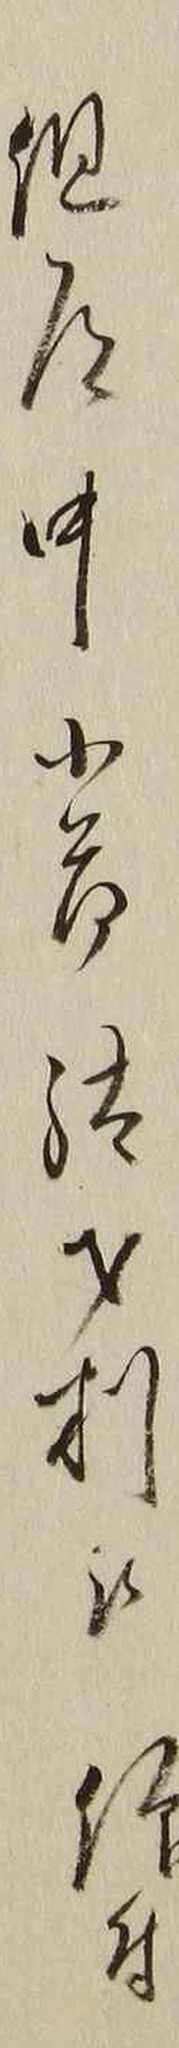但道中小荷駄才判被仰付
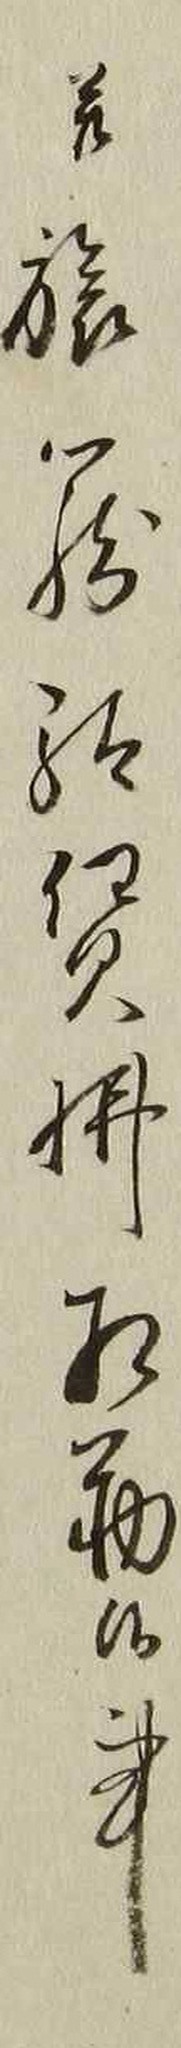并旅籠駄賃払相勤候事
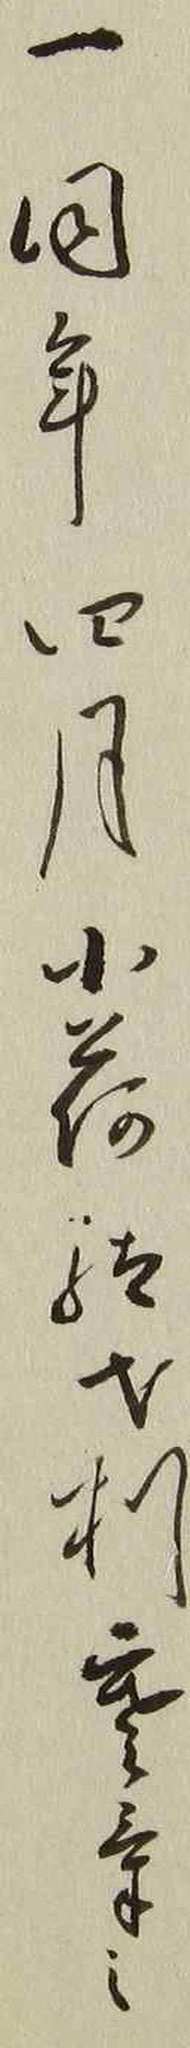一同年四月小荷駄才判寒気之
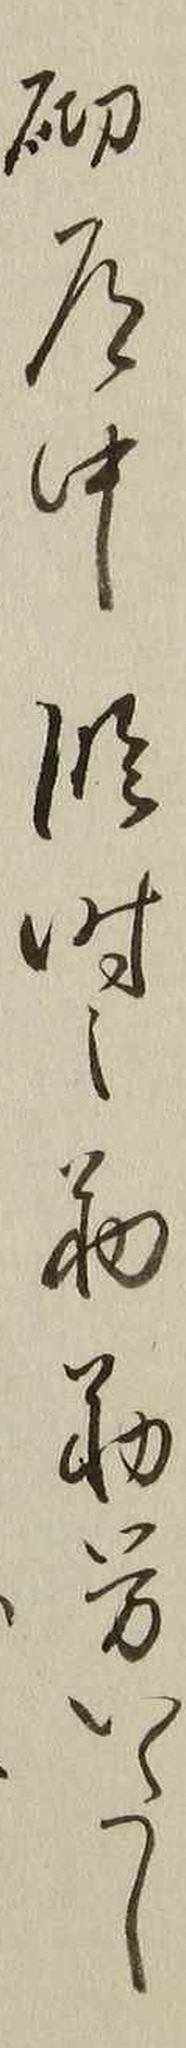砌道中臨時之勤勤労いたし
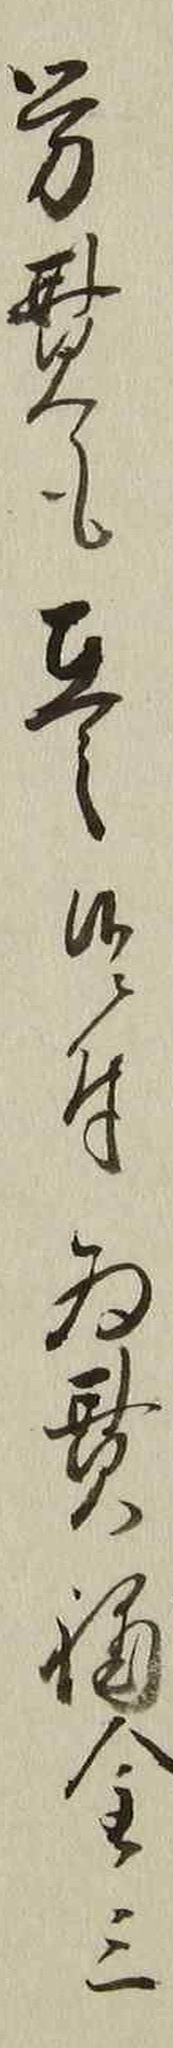労費も在之候ニ付為費補金三
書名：諸士系譜　巻之132　た之部8
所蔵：会津若松市立会津図書館
